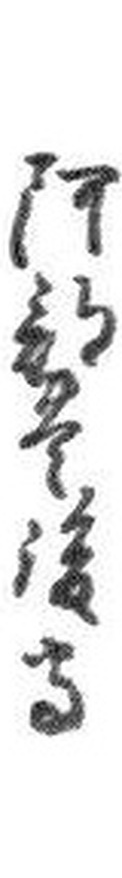阿部豊後守
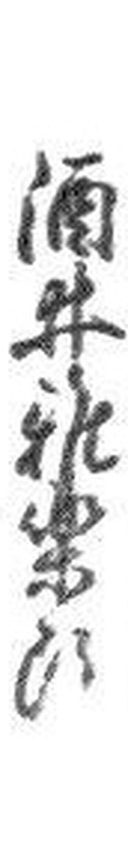酒井雅楽守
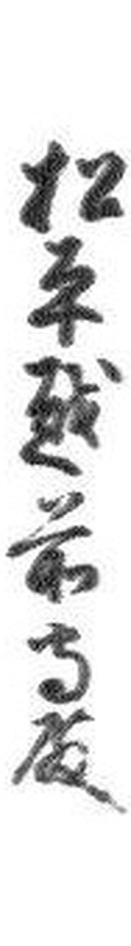松平越前守殿
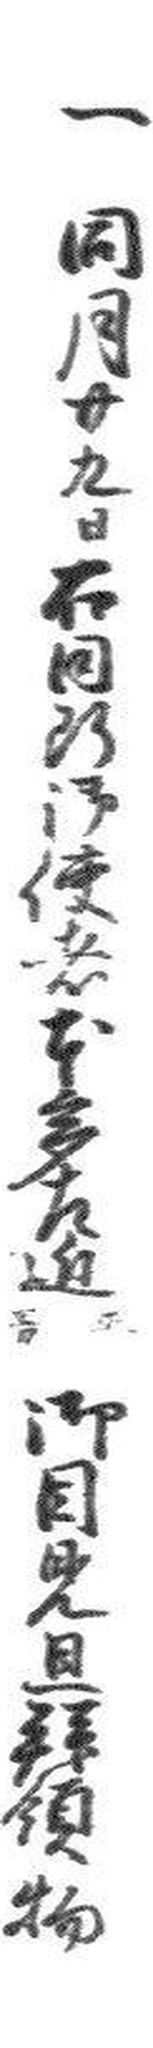一同月廿九日右同断御使者本多左近正房御目見拝領物

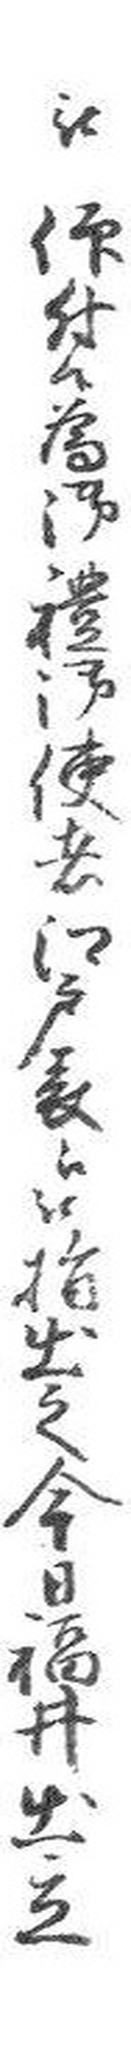被仰付候為御礼御使者江戸表江被指出之今日福井出立
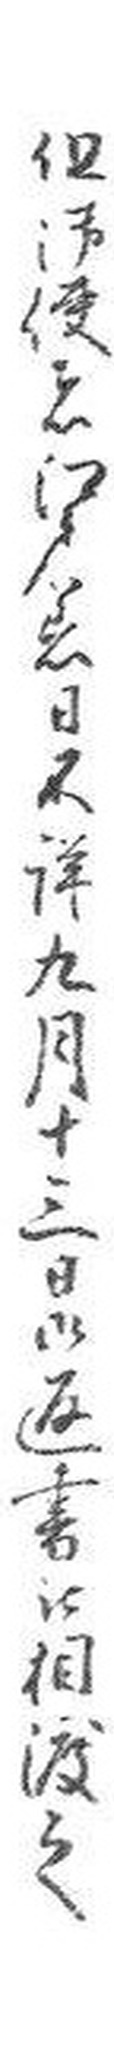但御使者江戸着日不詳九月十三日御返書被相渡之
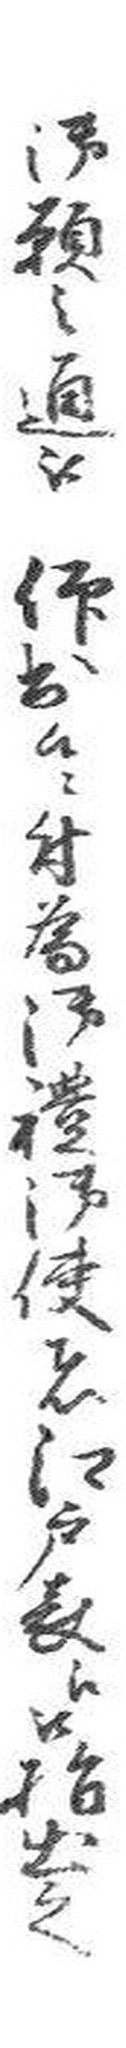御願之通被仰出候ニ付為御礼御使者江戸表江被指出之
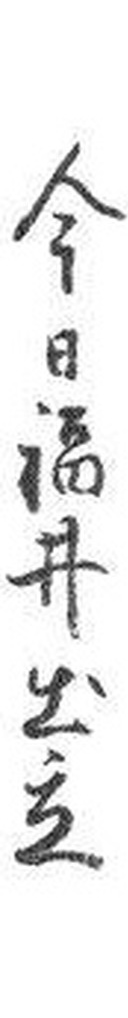今日福井出立
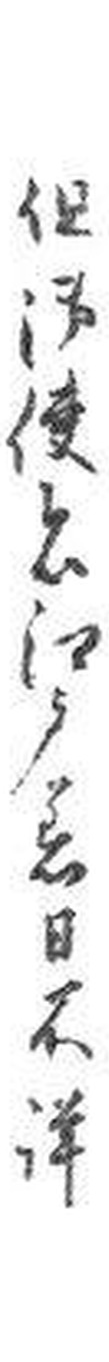但御使者江戸着日不詳
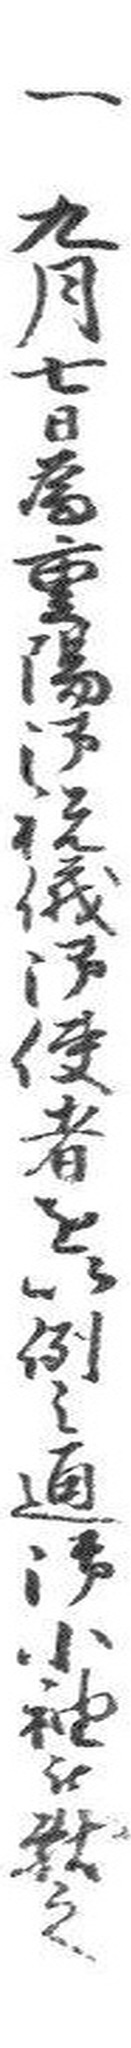一九月七日為重陽御祝儀御使者を以例之通御小袖被献之
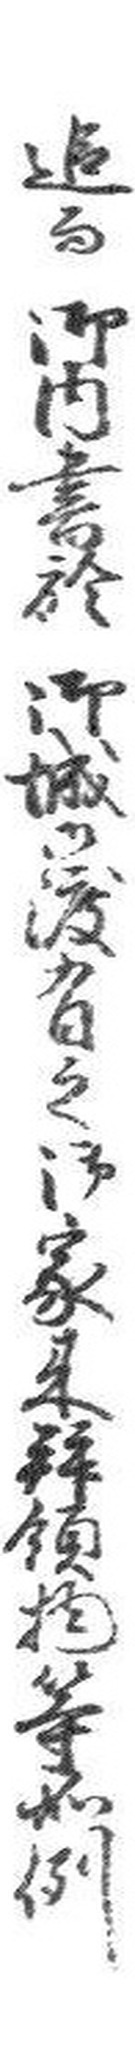追而御内書於御城御渡有之御家来拝領物等如例
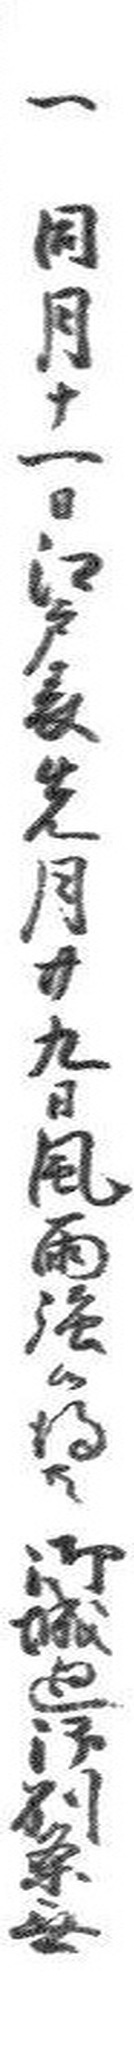一同月十一日江戸表先月廿九日風雨強候得共御城廻御別条無
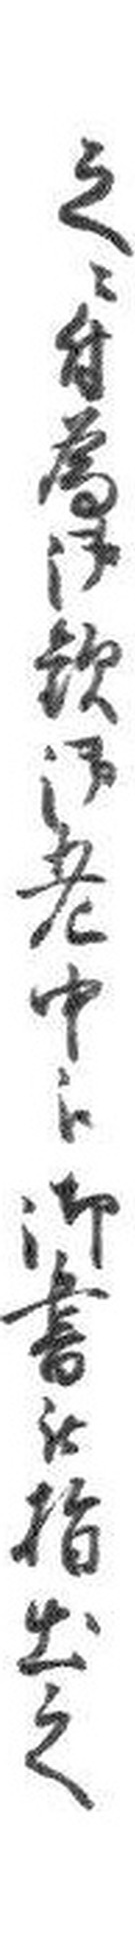之ニ付為御歓御老中江御書被指出之
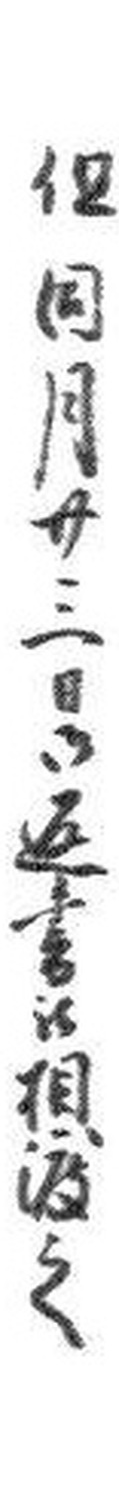但同月廿三日御返書被相渡之
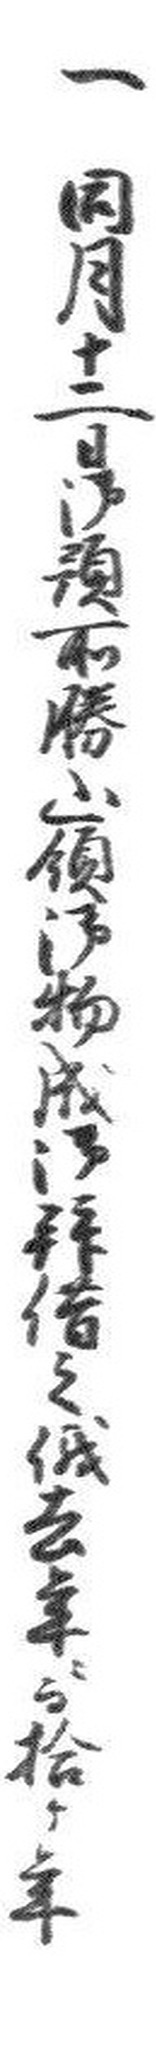一同月十二日御預所勝山領御物成御拝借之儀去年ニ而拾ヶ年
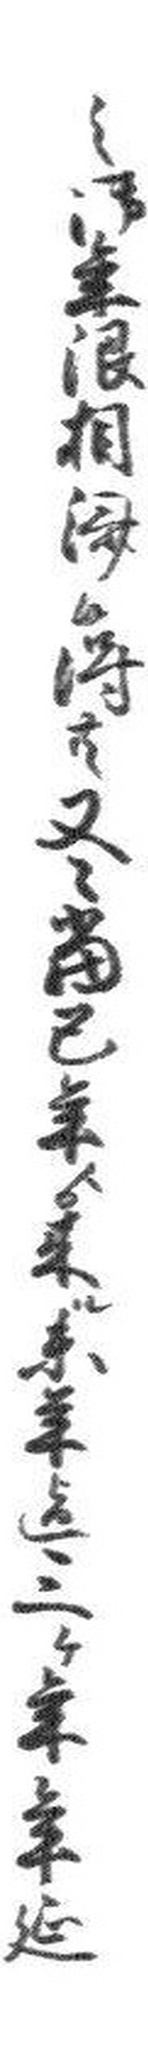之御年限相済候得共又々当巳年ゟ来ル未年迄三ヶ年
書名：家譜 七 光通公 従寛文四年到同九年
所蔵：福井県文書館 Fukui Prefectural Archives
